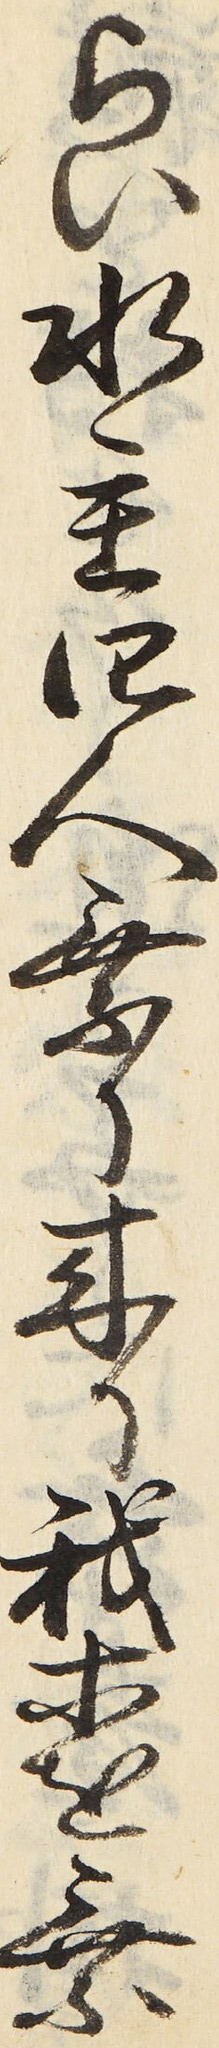らい水主四人乗り来り我等を乗
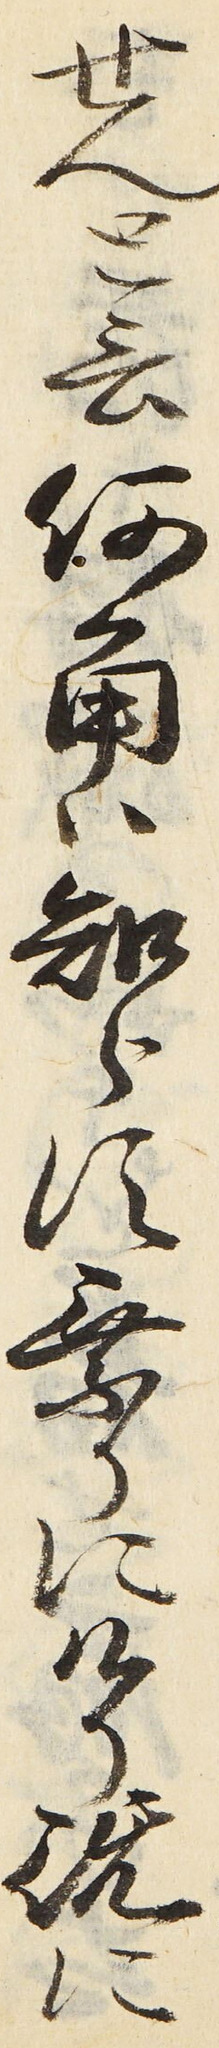せんと云何角は知らす乗りにけり既に
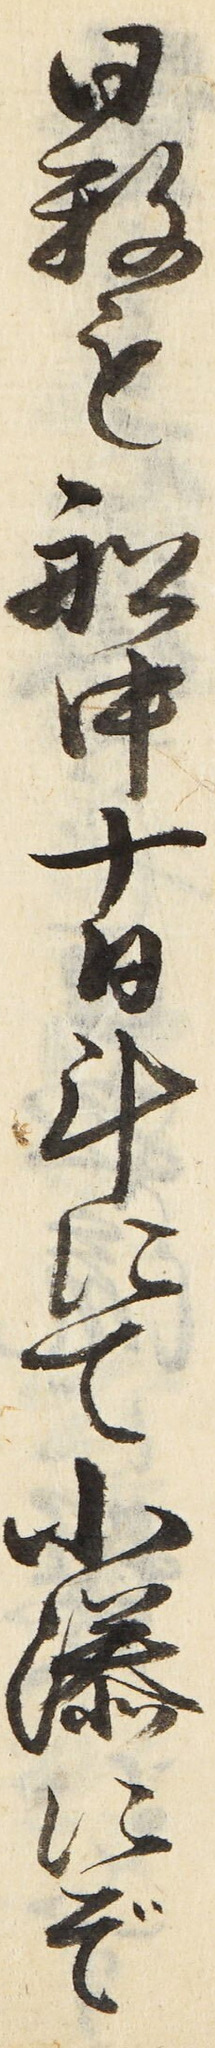日数も船中十日計にて小湊にぞ
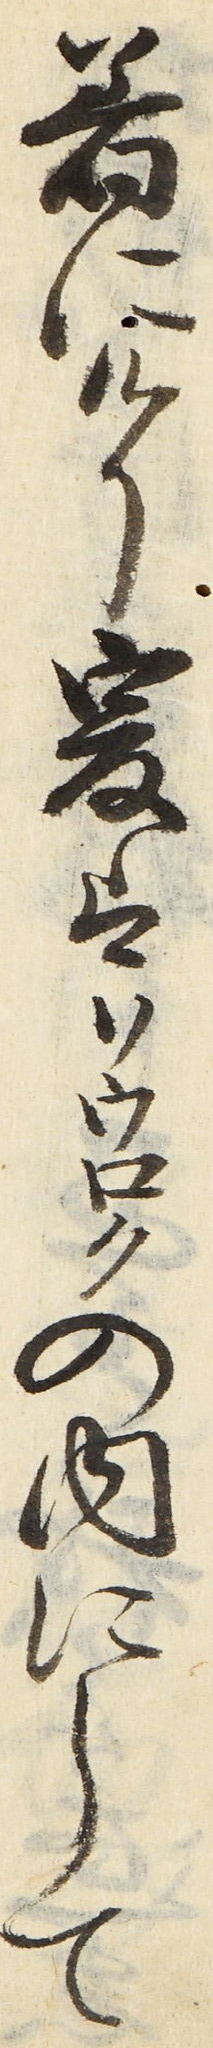着にけり爰はソウロクの内にして
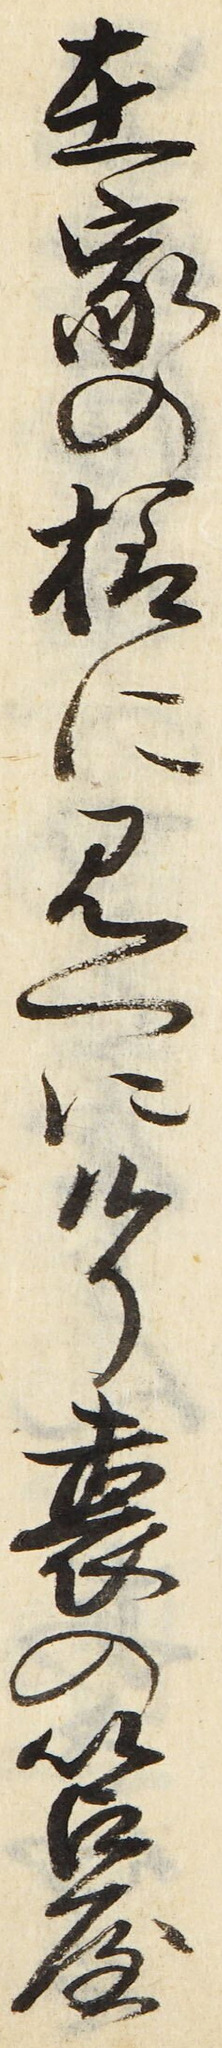在家の様に見へにけり裏の苫屋
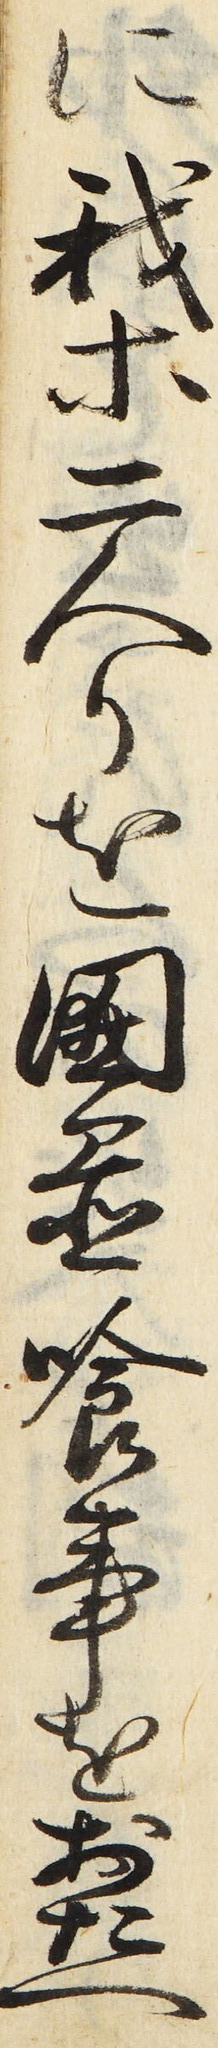に我等二人りを囲置喰事をあたへ

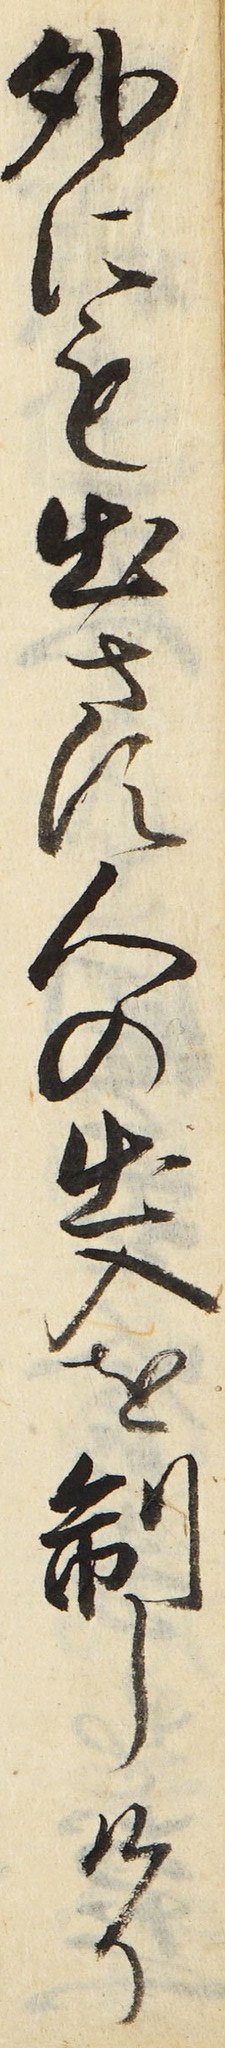外にも出さす人の出入を制しけり
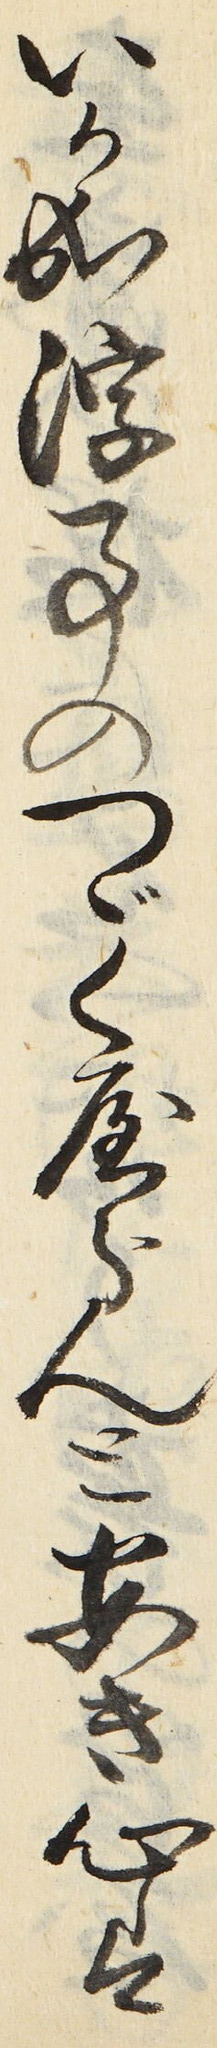いか成浮事のつゞくやらんと安き心は
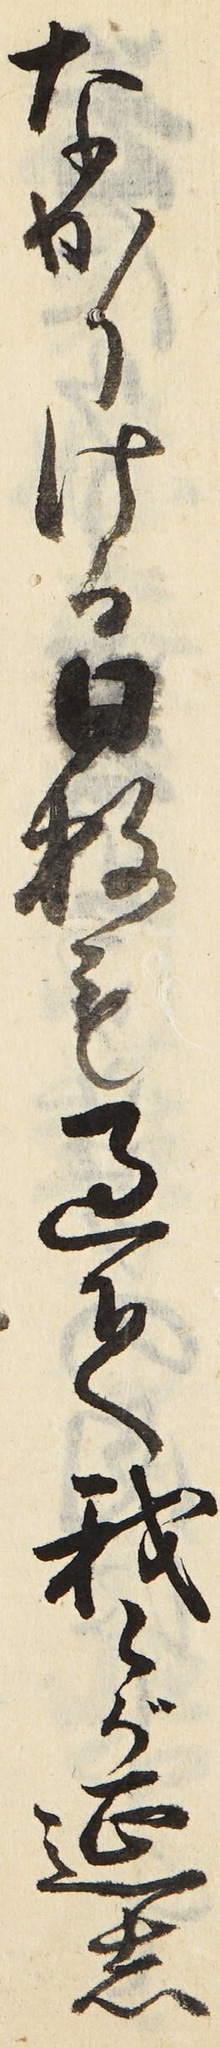なかりける日数も過て我々が延し
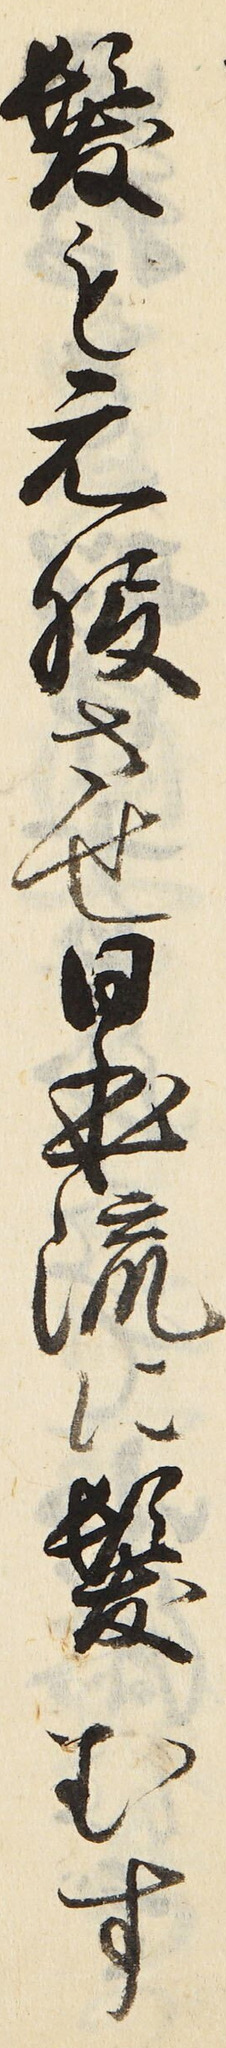髪も元結させ日本流に髪むす
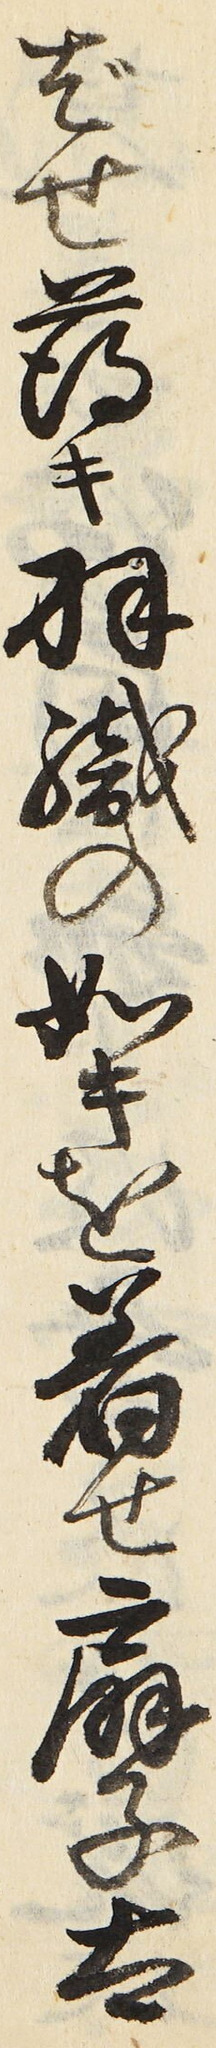ばせ薄き羽織の如きを着せ扇子太
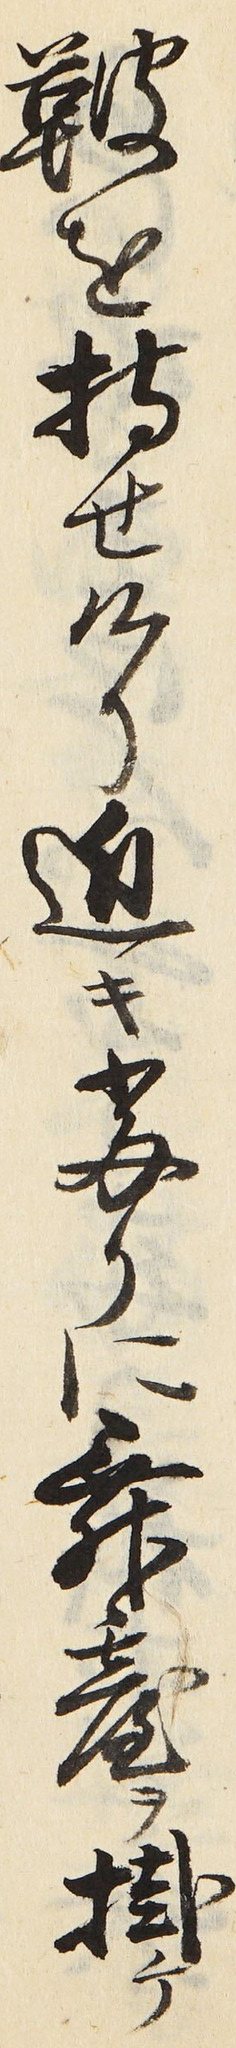鼓を持せけり近き当りに舞台を掛け
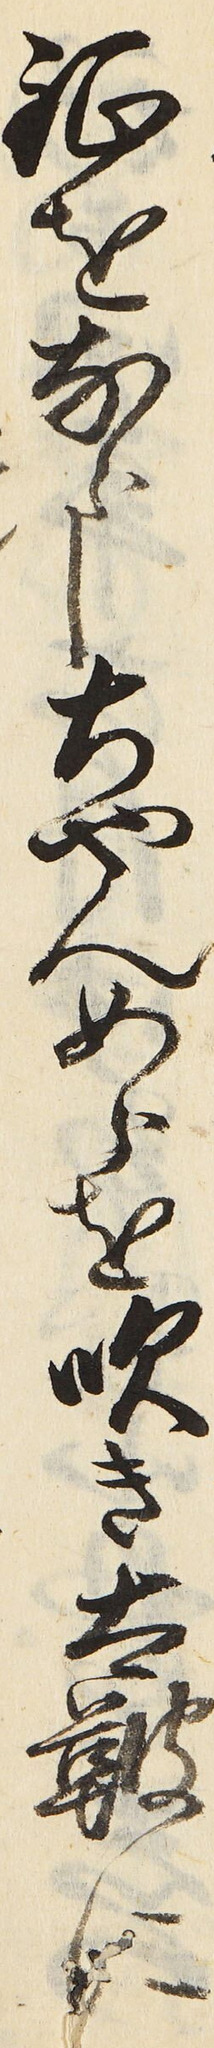鉦をならしちゃんめらを吹き太鼓に
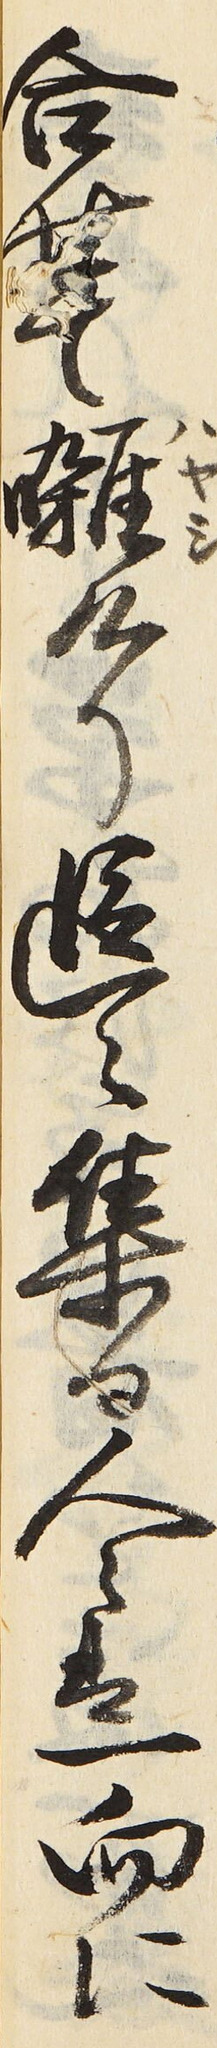合せて囃けり追々集る人々は一向に
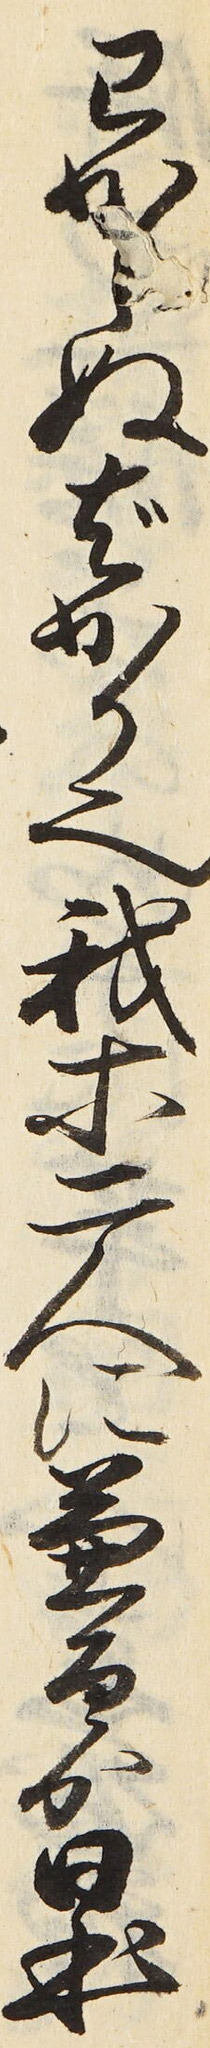わからぬばかり也我等二人に兼而ゟ日本
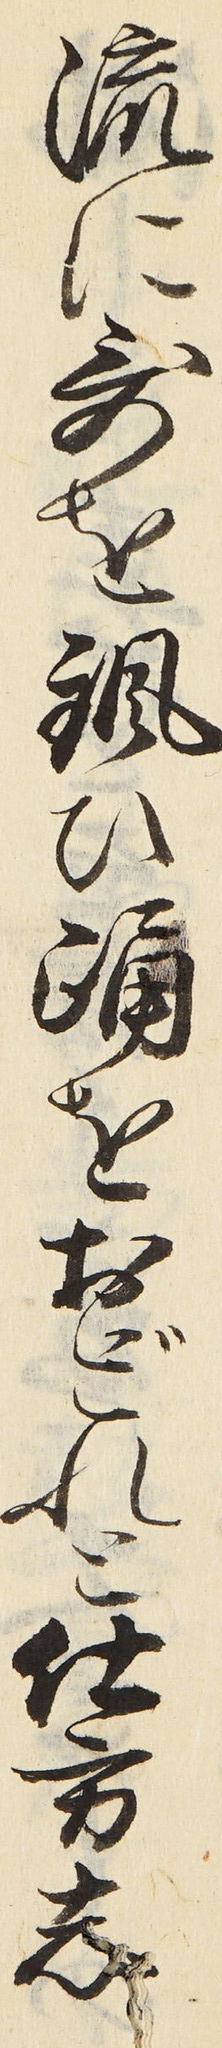流に哥を諷ひ踊をおどれと仕方し
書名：華夷九年録
